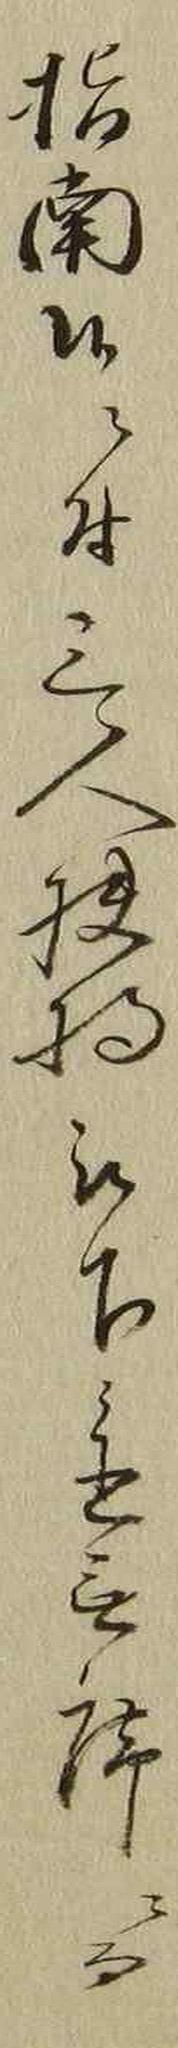指南候ニ付三人扶持被下置無席ニ而
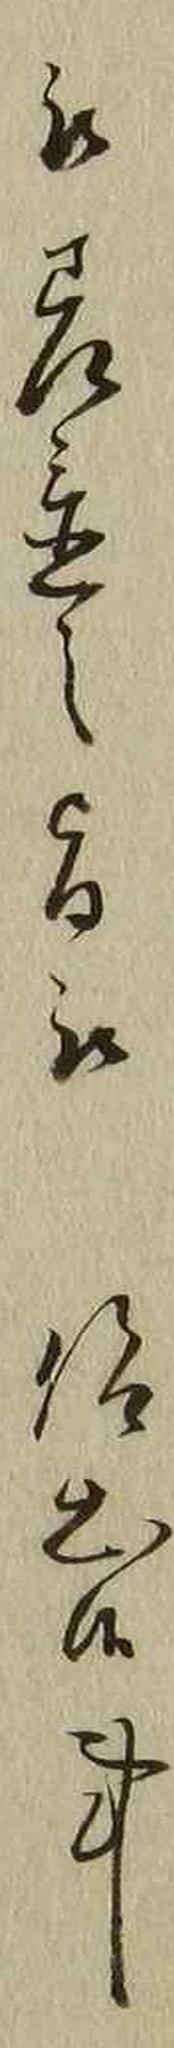被差置之旨被仰出候事
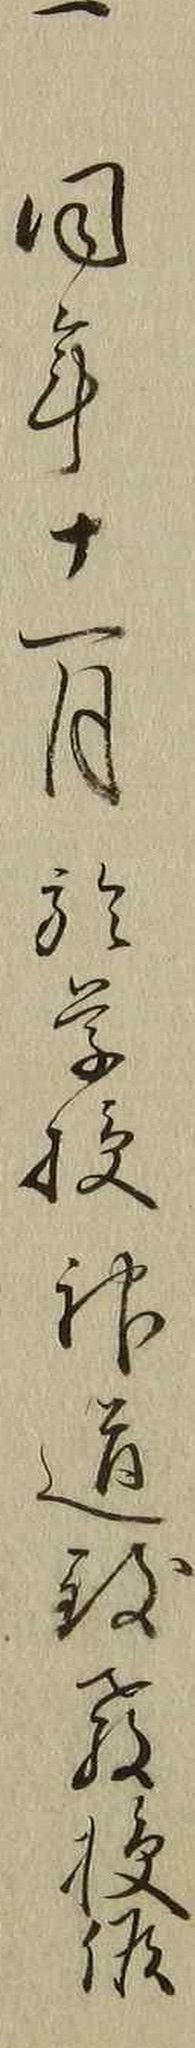一同年十一月於学校神道致教授候
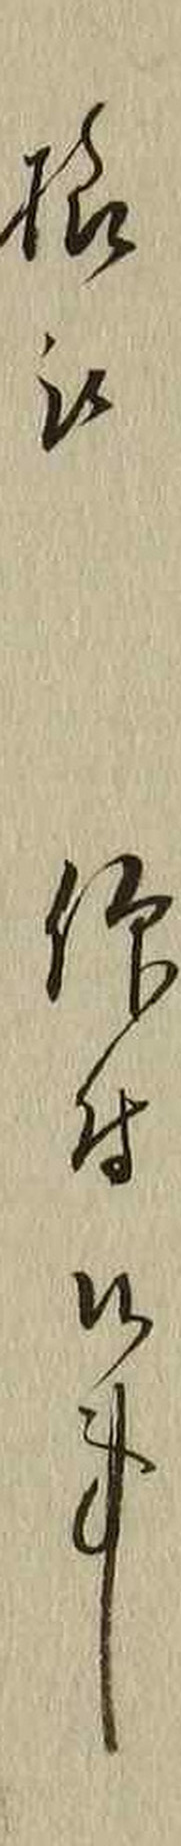様被仰付候事
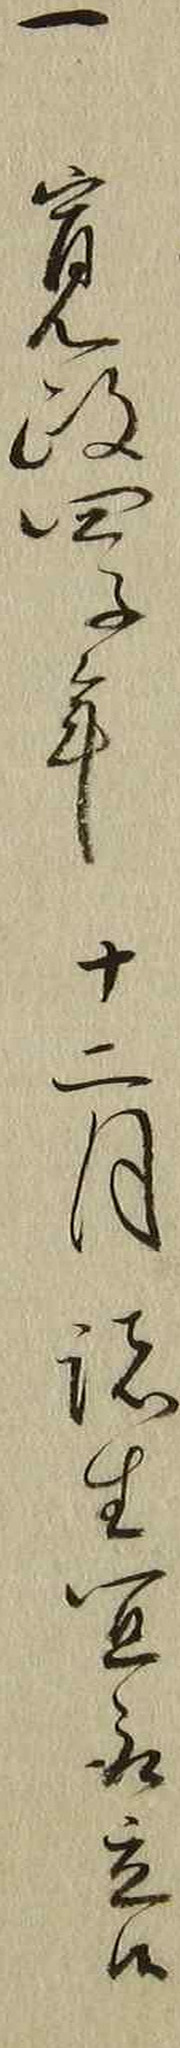一寛政四子年十二月諸生宜取立候
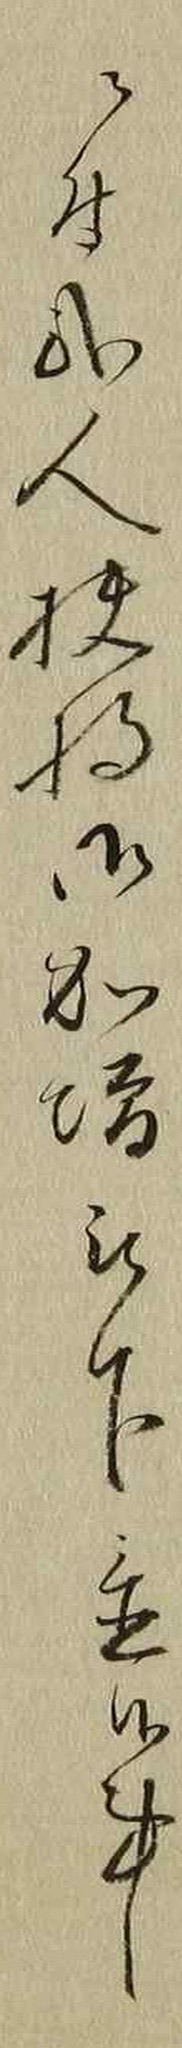ニ付弐人扶持御加増被下置候事
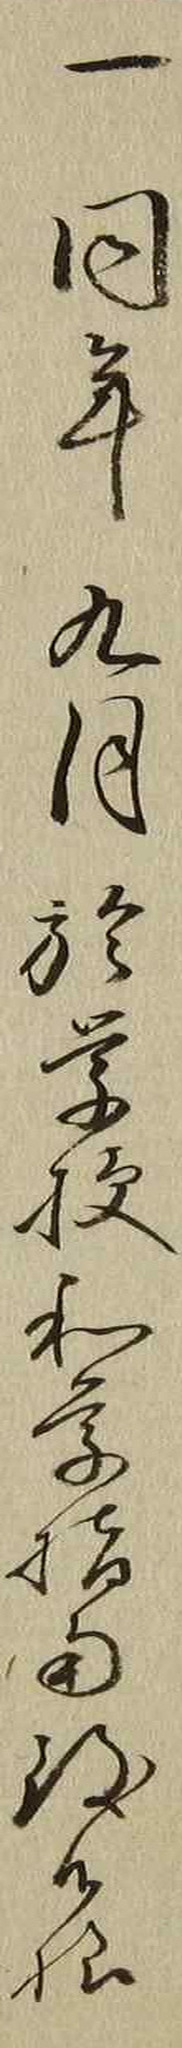一同年九月於学校和学指南致候様
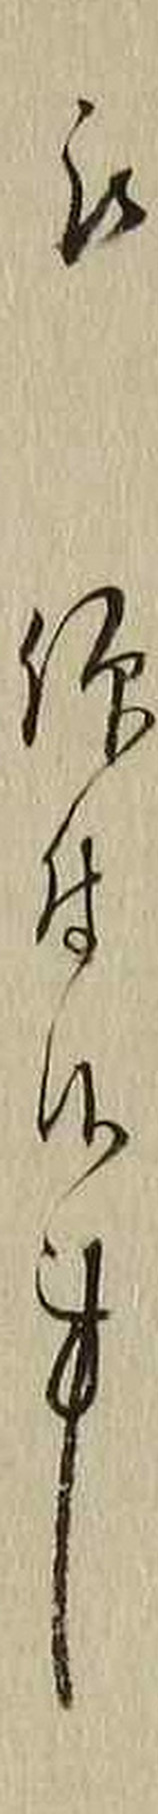被仰付候事
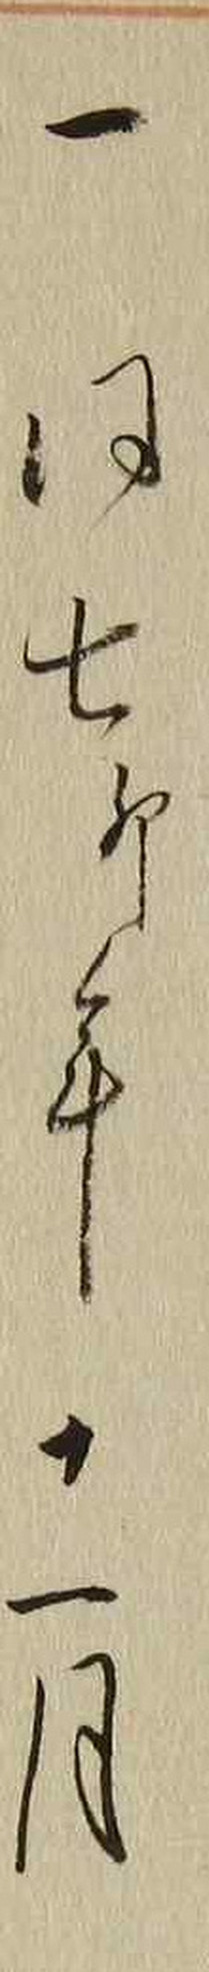一同七卯年十一月
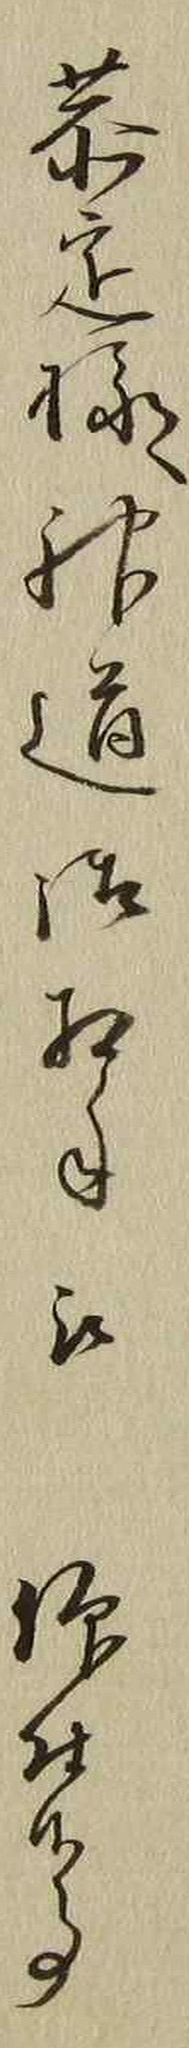恭定様へ神道御相手被仰付候事
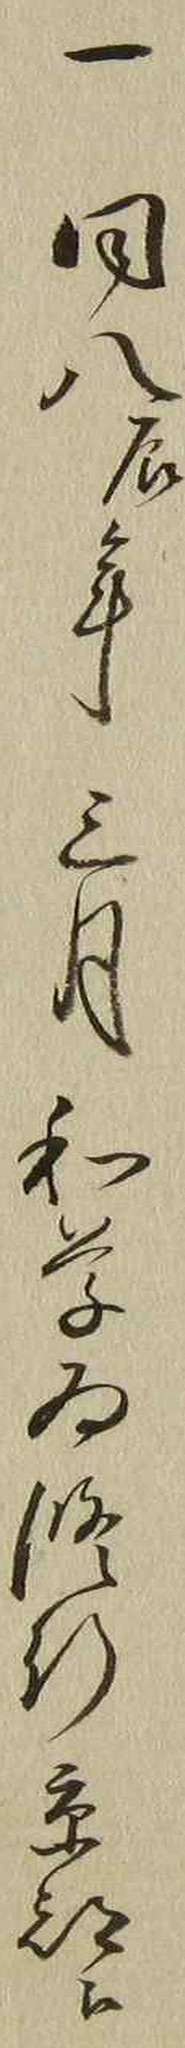一同八辰年三月和学為修行京都江
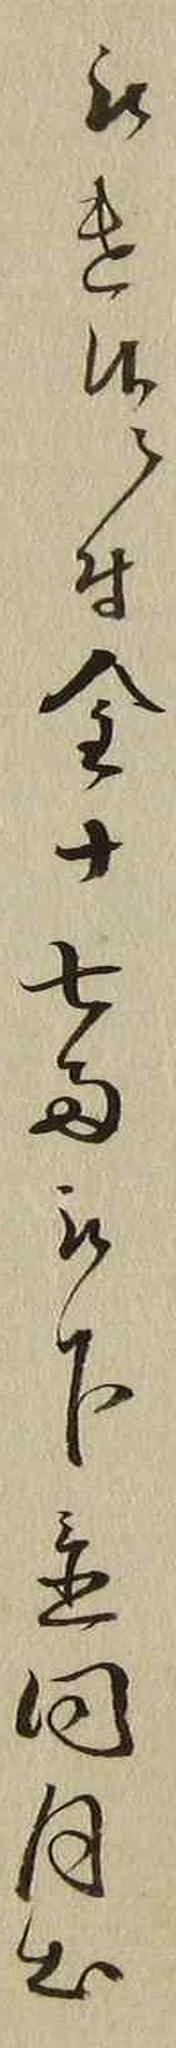被遣候ニ付金十七両被下置同月出
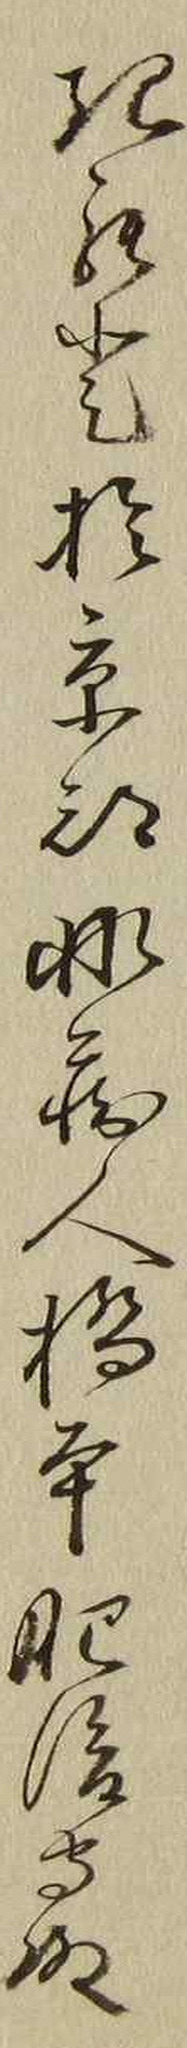起罷登於京都非蔵人橋本肥後守殿
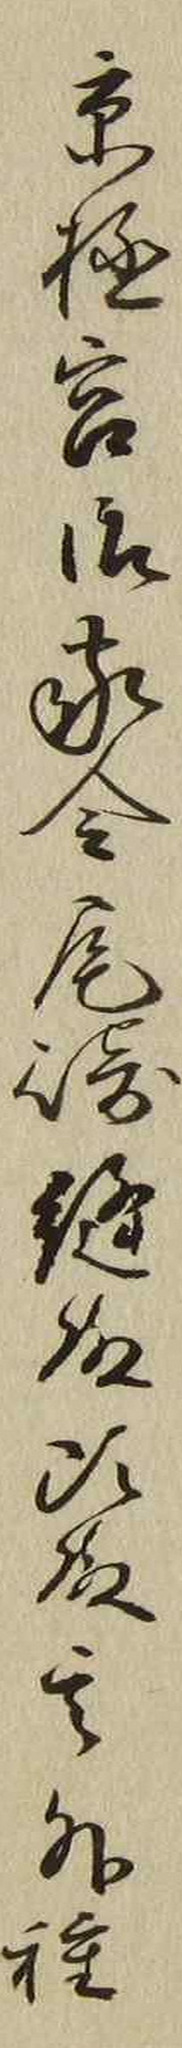京極宮御家令尾崎縫殿頭殿其外種
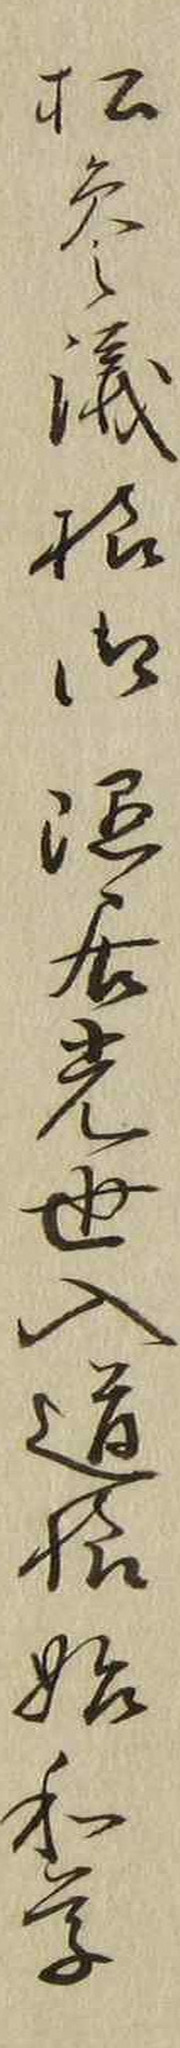松参議様御隠居光世入道様始和学
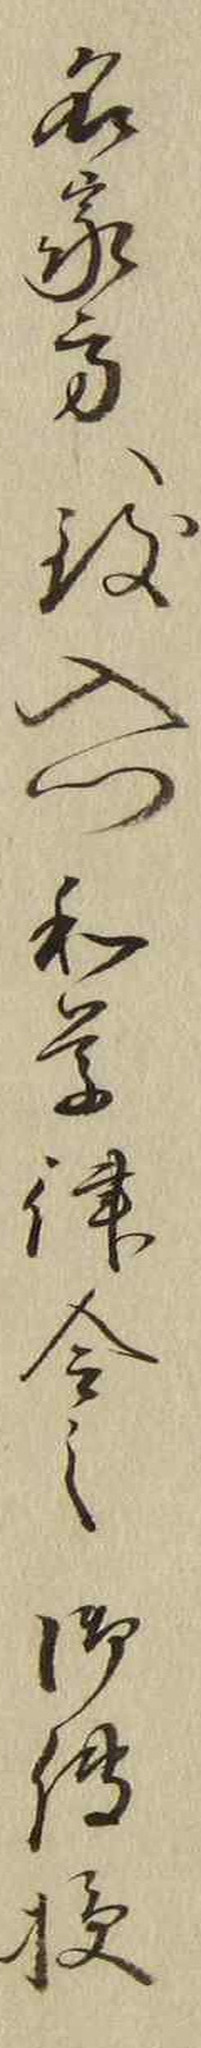名家方ヘ致入門和学律令之御伝授
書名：諸士系譜　巻之68　を之部2
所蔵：会津若松市立会津図書館
